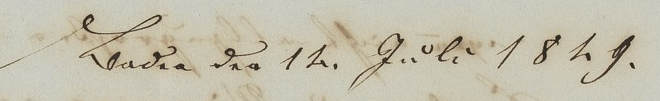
Baden den 14. Juli 1849.
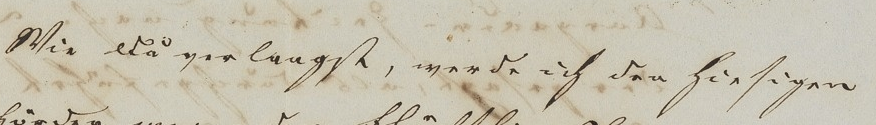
Wie Du verlangst, werde ich den hiesigen
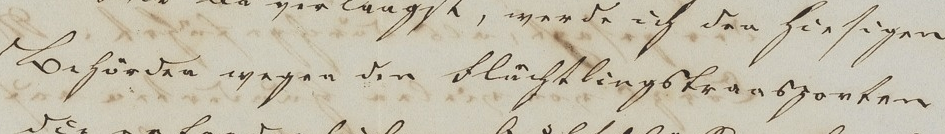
Behörden wegen den Flüchtlings Transporten
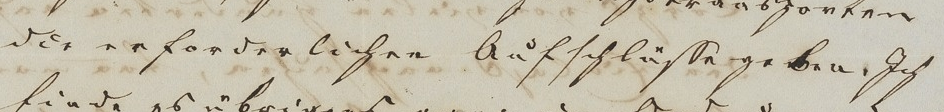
die erforderlichen Aufschlüsse geben. Ich
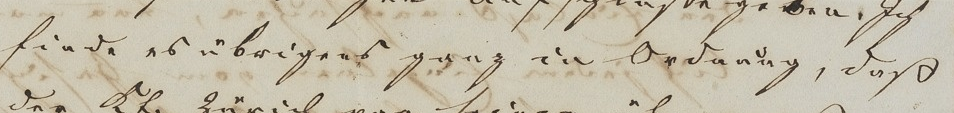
finde es übrigens ganz in Ordnung, daß
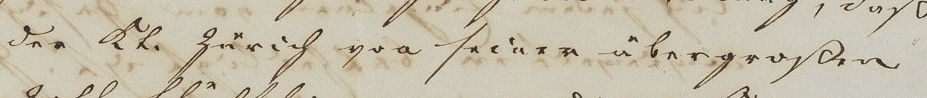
der Kt. Zürich von seiner übergroßen
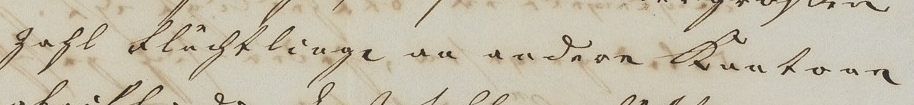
Zahl Flüchtlinge an andere Kantone
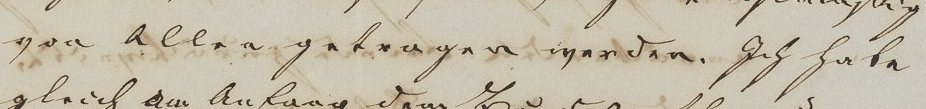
von Allen getragen werden. Ich habe
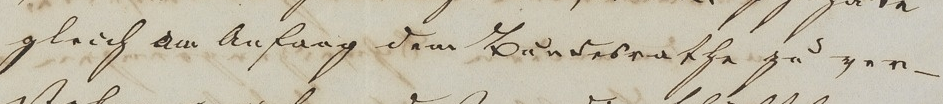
gleich am Anfang dem Bundesrathe zu ver-
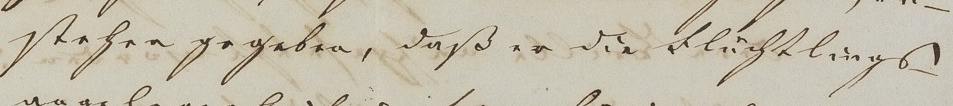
stehen gegeben, daß er die Flüchtlings-
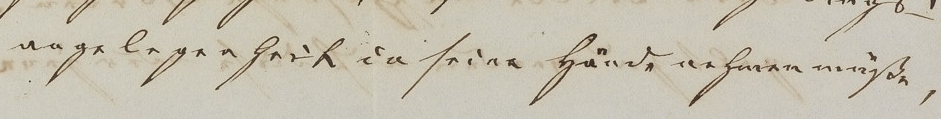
angelegenheit in seine Hände nehmen müße,
